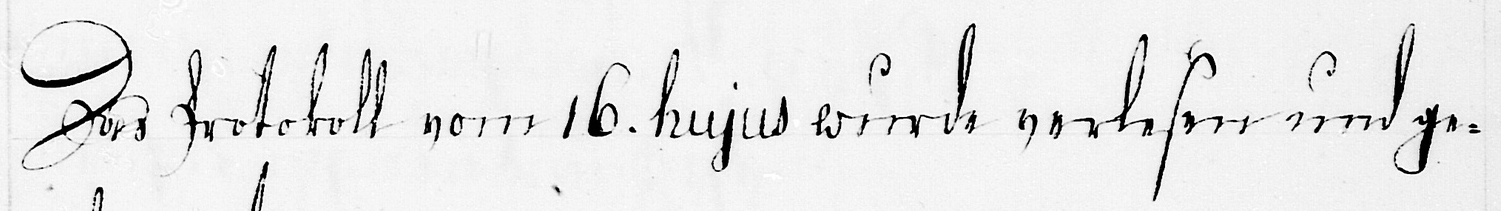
Das Protokoll vom 16. hujus wurde verlesen und ge¬
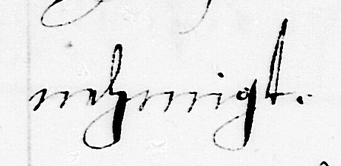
nehmigt.
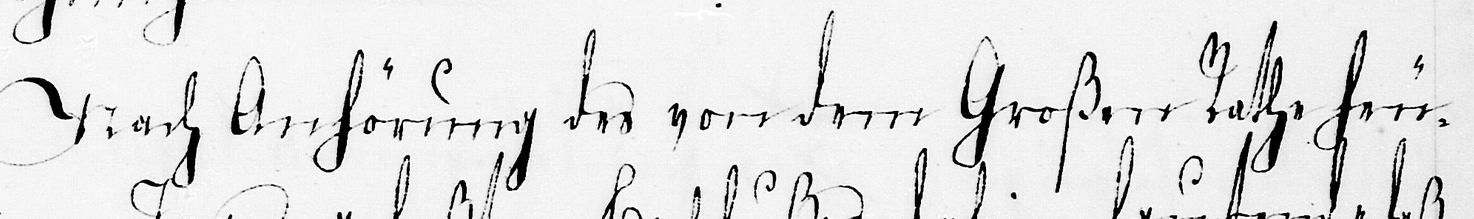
Nach Anhörung des von dem Großen Rathe heu¬
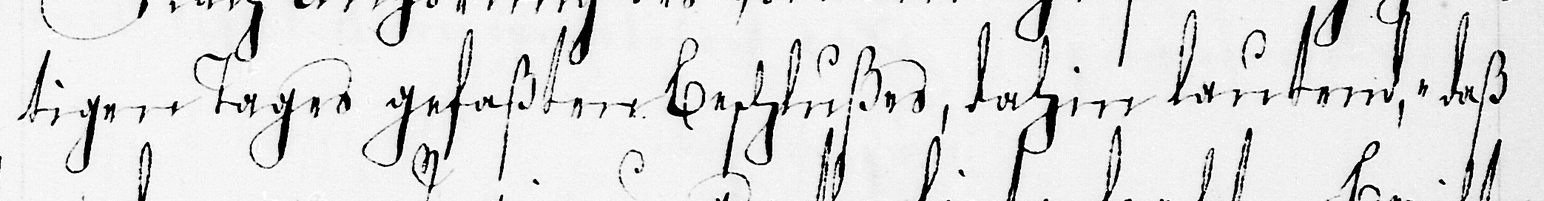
tigen Tages gefaßten Beschlußes, dahin lautend, „daß
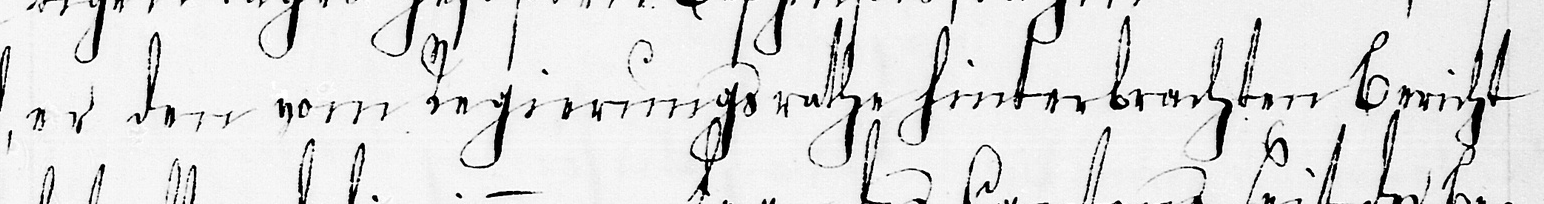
er den vom Regierungsrathe hinterbrachten Bericht
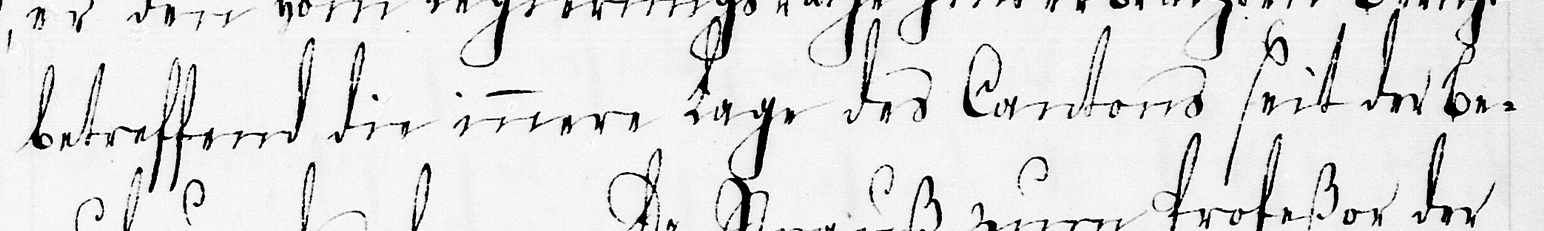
betreffend die innere Lage des Cantons seit der Be¬
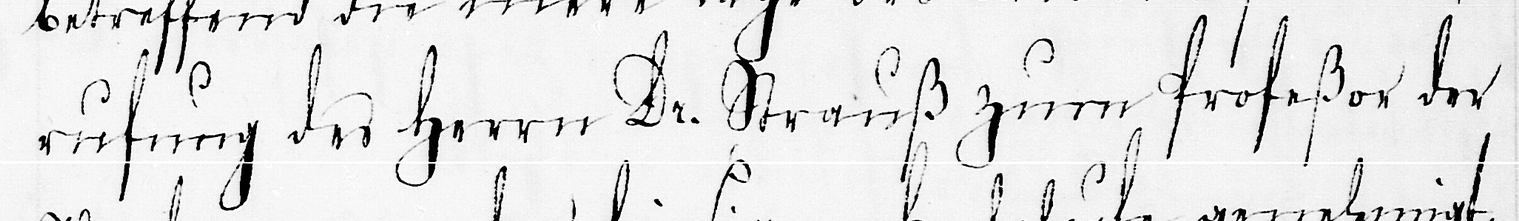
rufung des Herrn Dr. Strauß zum Profeßor der
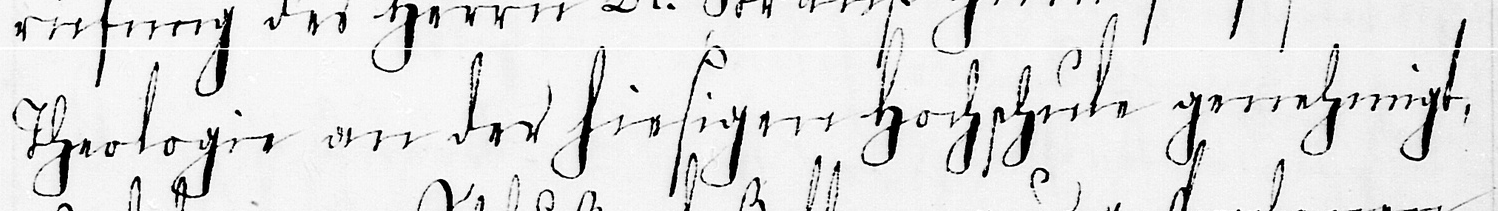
Theologie an der hiesigen Hochschule genehmigt,
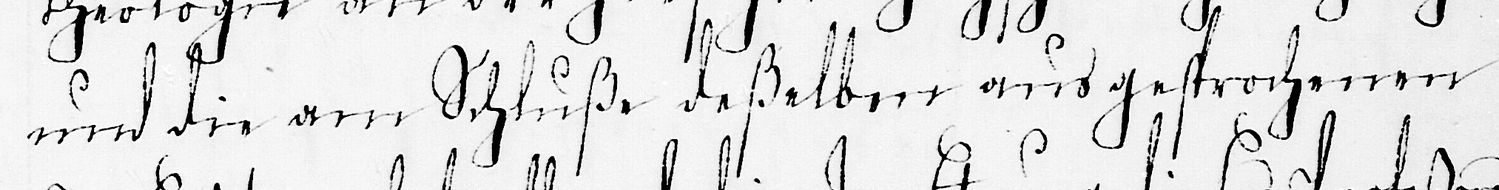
und die am Schluße deßelben ausgesprochenen
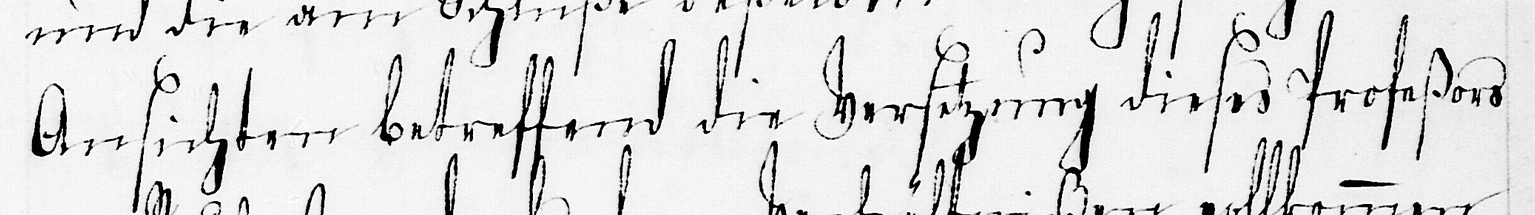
Ansichten betreffend die Versetzung dieses Profeßors
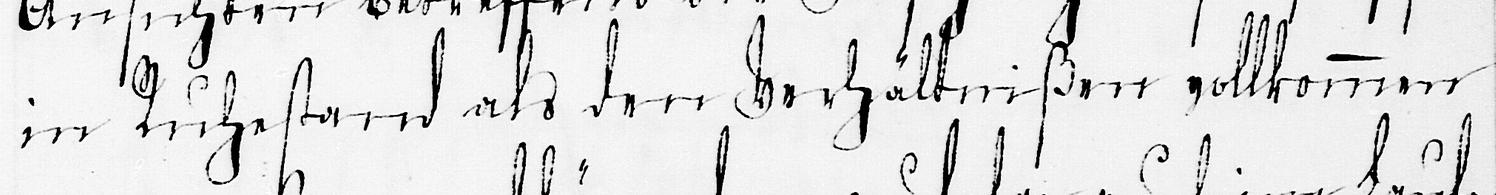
in Ruhestand als den Verhältnißen vollkommen
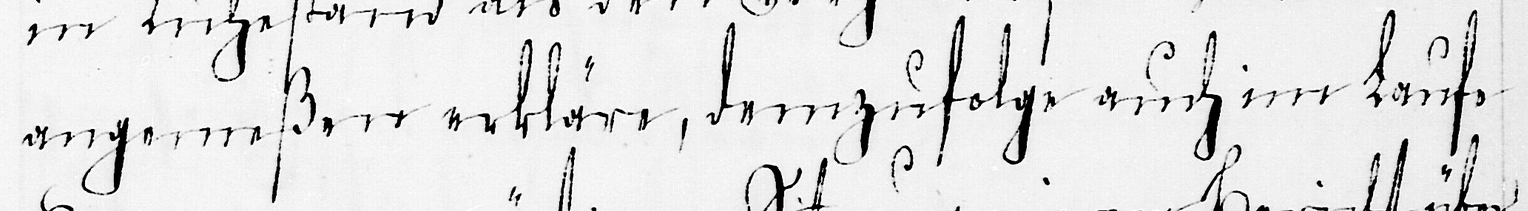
angemeßen erkläre, demzufolge auch im Laufe
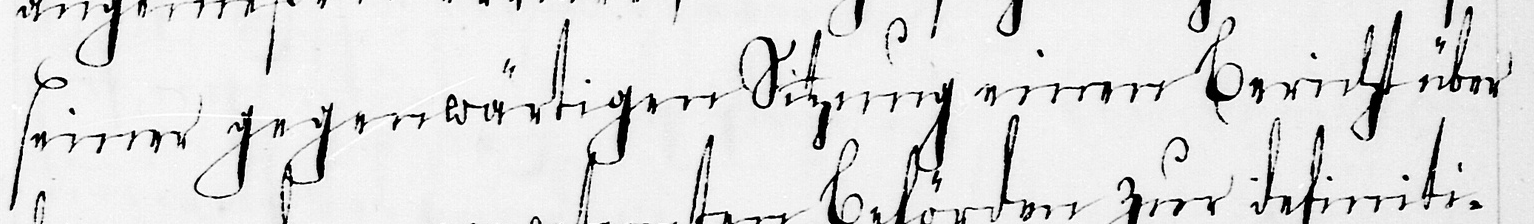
seiner gegenwärtigen Sitzung einen Bericht über
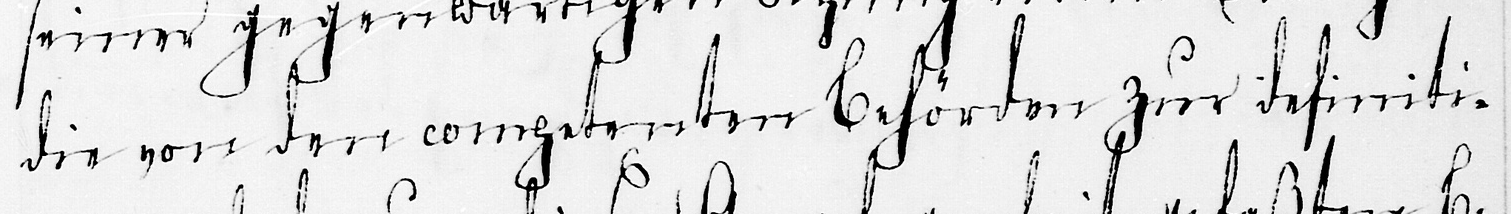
die von den competenten Behörden zur definiti¬
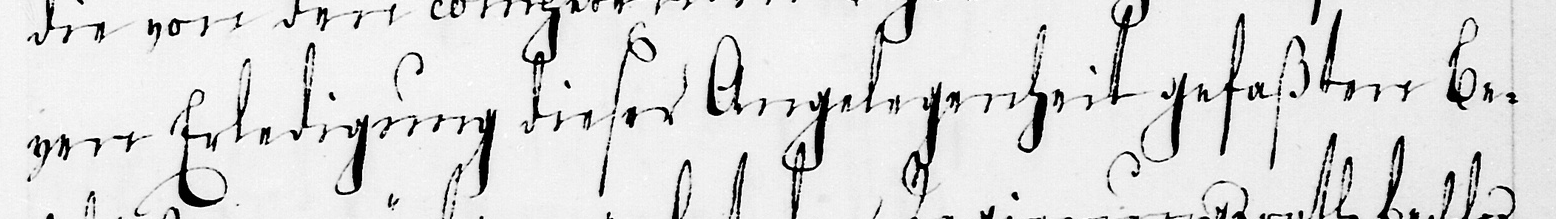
ven Erledigung dieser Angelegenheit gefaßten Be¬
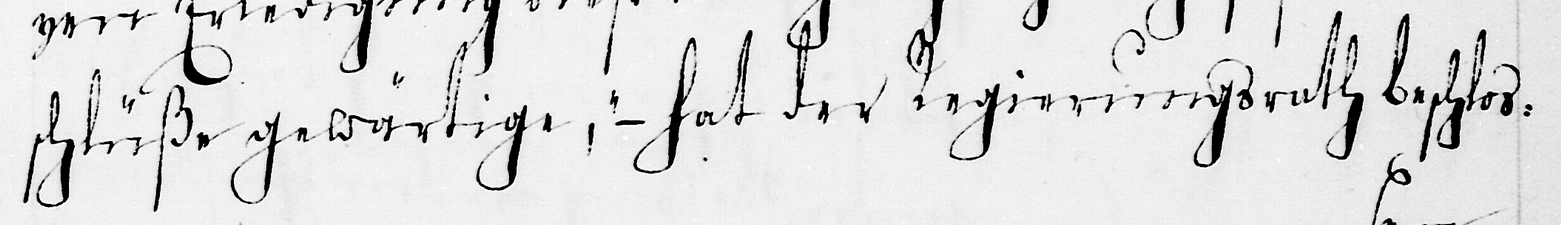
schlüße gewärtige,“ – hat der Regierungsrath beschlos-
